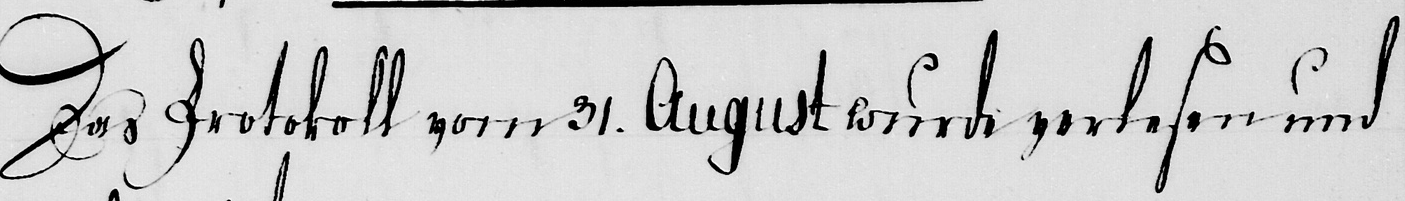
Das Protokoll vom 31. August wurde verlesen und
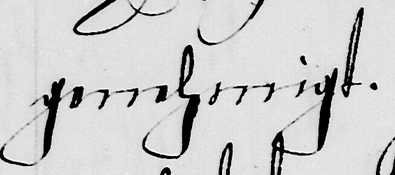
genehmigt.
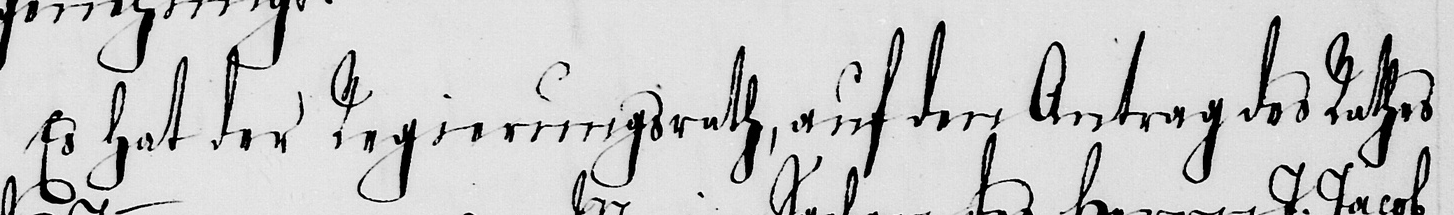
Es hat der Regierungsrath, auf den Antrag des Rath¬
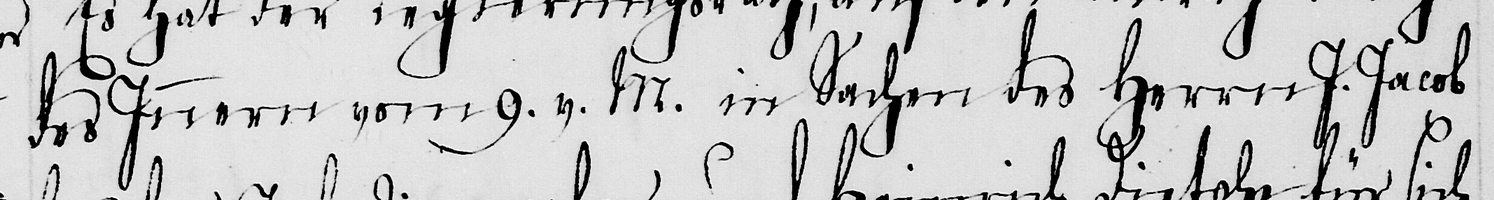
des Innern vom 9. v. M. in Sachen des Herrn J. Jacob
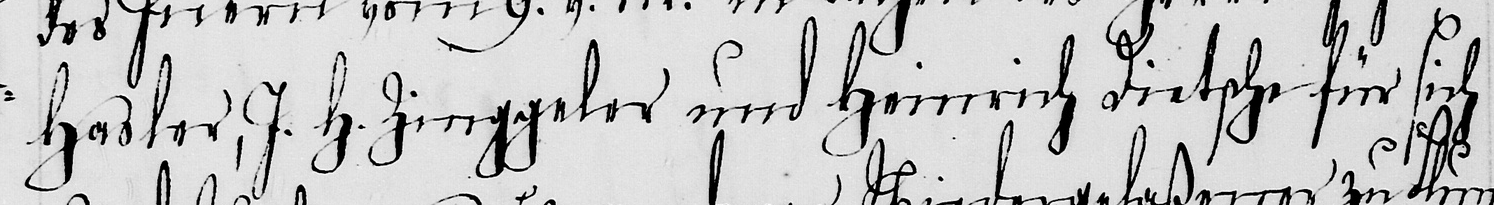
Hasler, J. H. Zinggeler und Heinrich Dietsche für sich
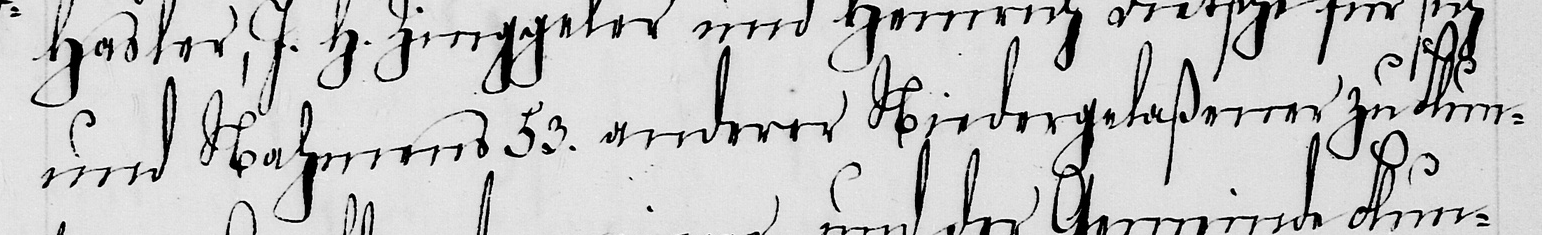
und Nahmens 53. anderer Niedergelaßener zu Flun¬
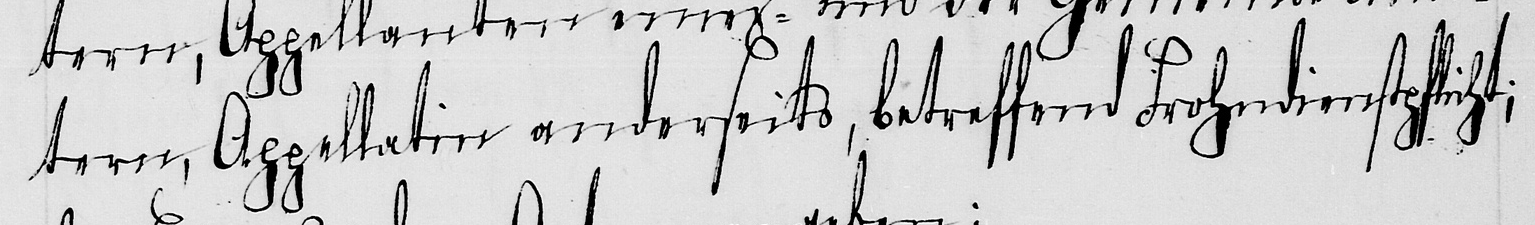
tern, Appellatin anderseits, betreffend Frohndienstpfli¬
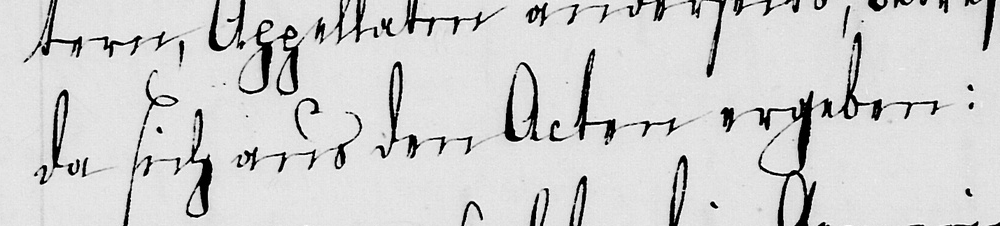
da sich aus den Acten ergeben:
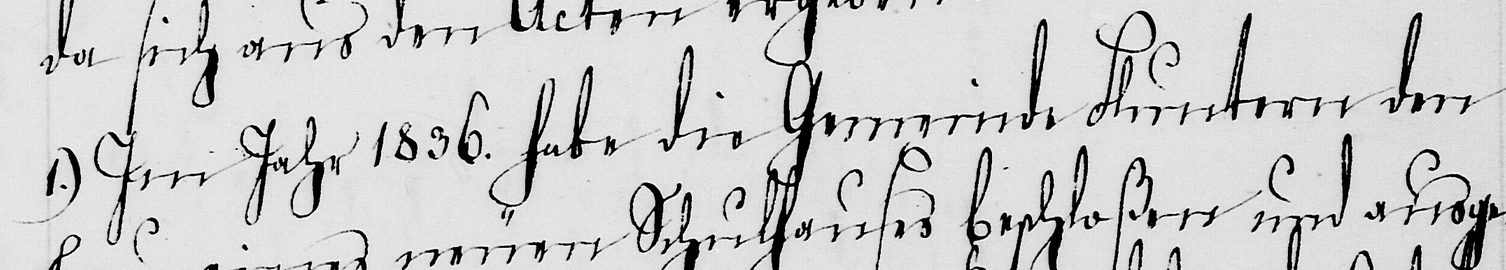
1.) Im Jahr 1836. habe die Gemeinde Fluntern den
